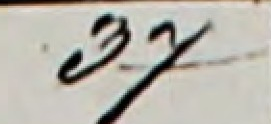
37
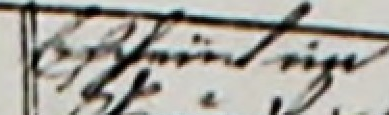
Esseint im
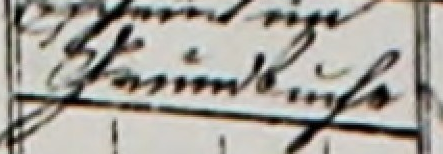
Grundbuche
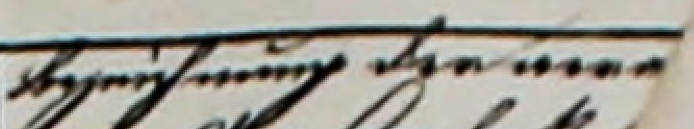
Bezeichnung der erarischen
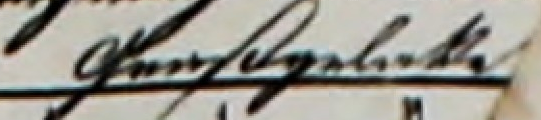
Graßgelake
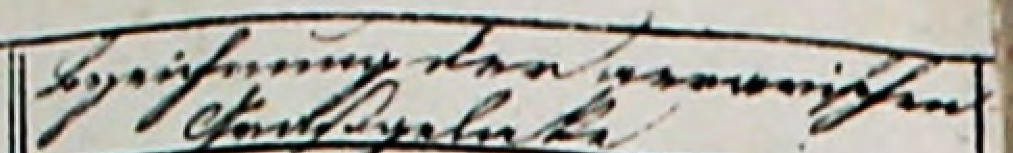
Bezeichnung der erarischen
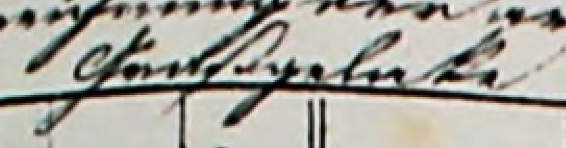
Graßgelake
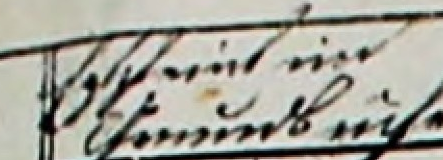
Esseint im
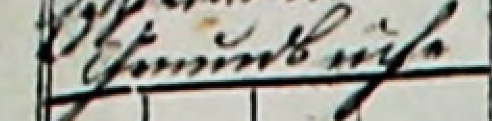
Grundbuche
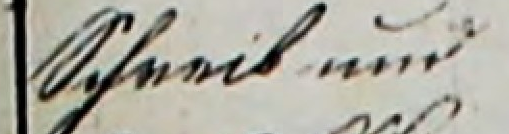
Schreib und
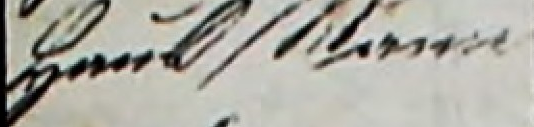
Haus Name
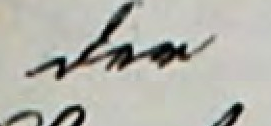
der
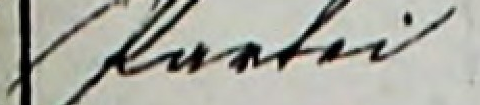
Partei.
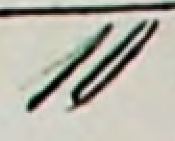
10
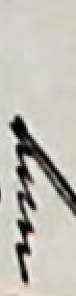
ung
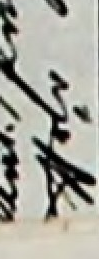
H???
